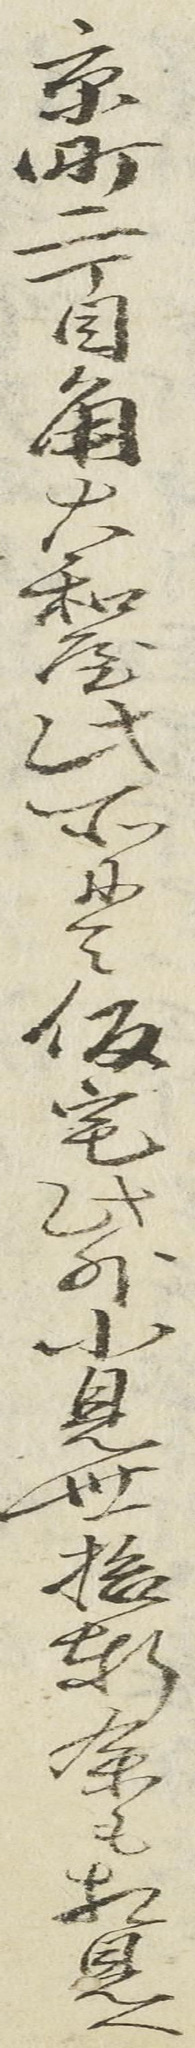京町二丁目角大和屋此所にて仮宅此外小見世拾軒余も相見へ
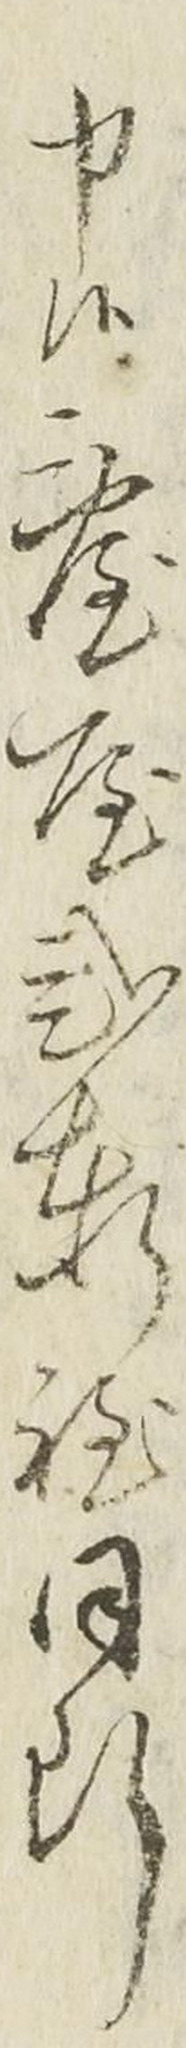申候臺屋弐軒程同断
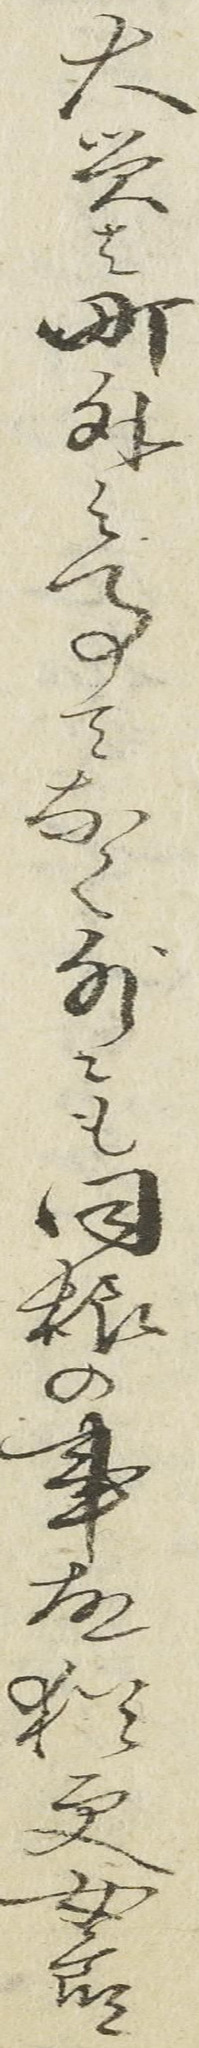大災は町外之事でなく外二も同様の事故猶更女郎
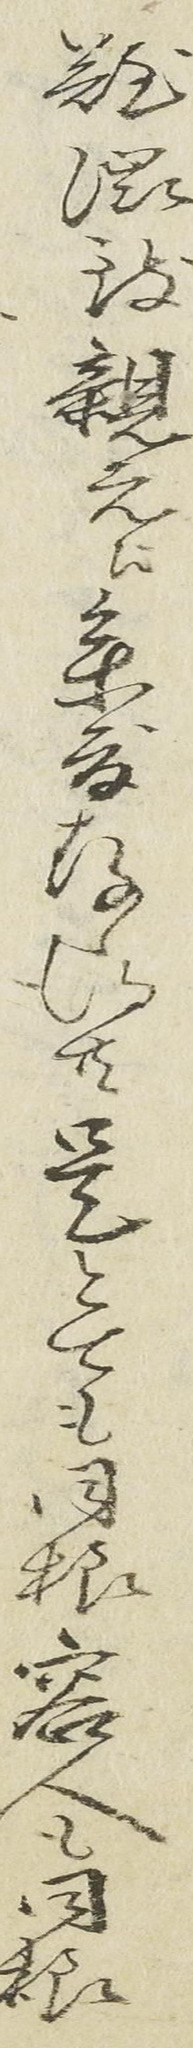難渋致親元え参度存候得共是とても同様容人も同様
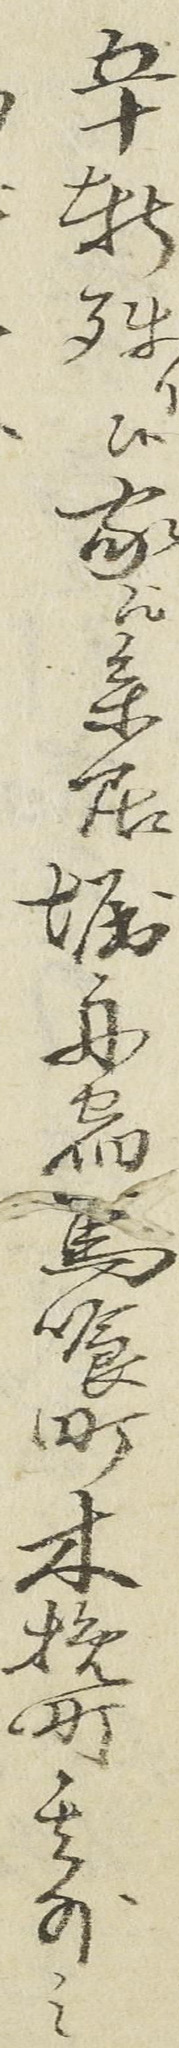五十軒残り候家え参居堀舟宿馬喰町木挽町其外之
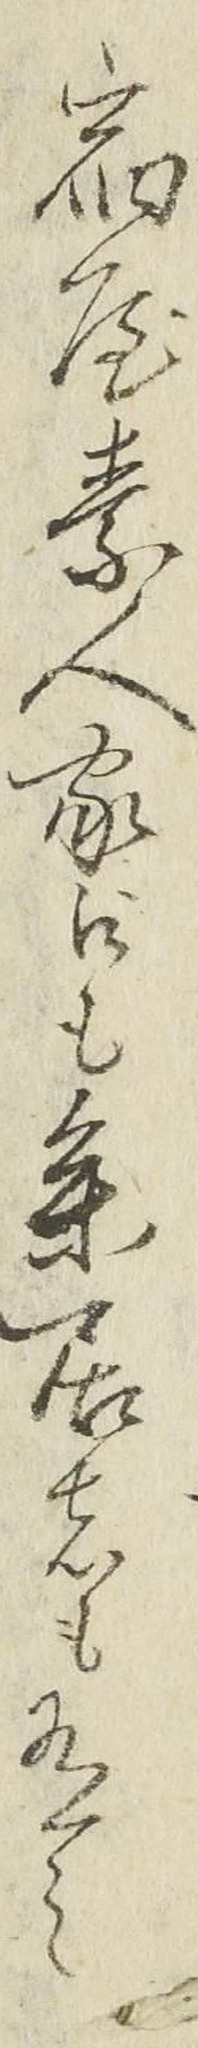宿屋素人家えも参居者も有之

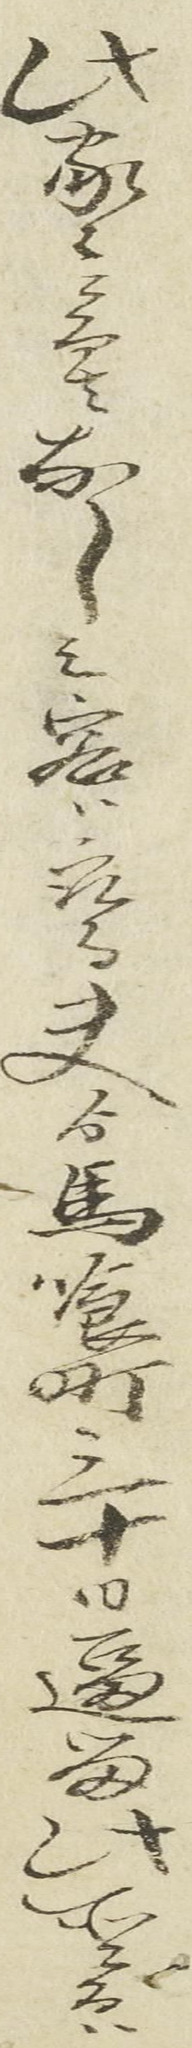此家々ニ而はなしミ容ハ取る夫ゟ馬喰町三十日逼留此所ニ而は
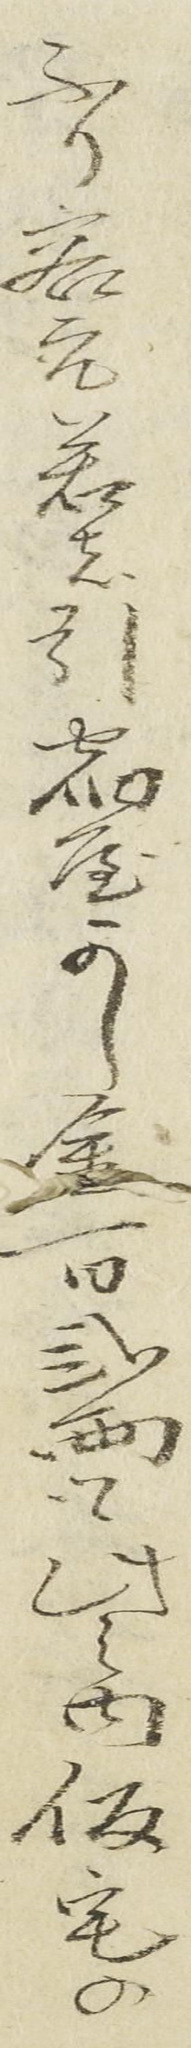ふり客取若者引宿屋かし金一日弐両ツゞ此之内仮宅の
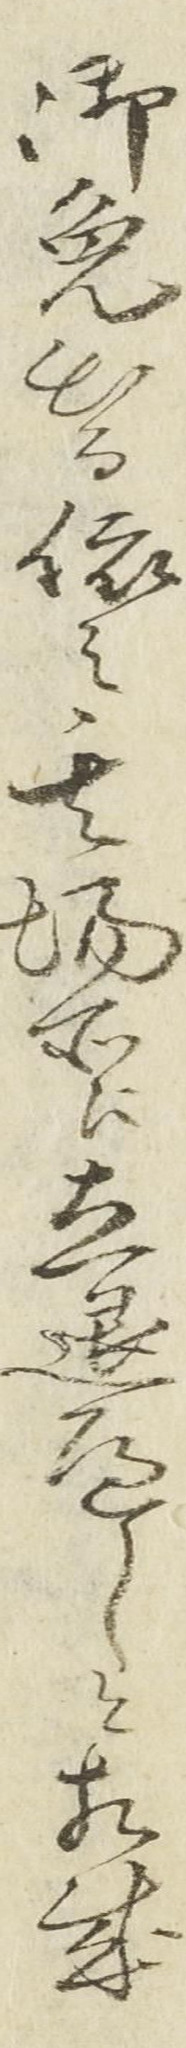御免出る依之其場所え立退過しと相成
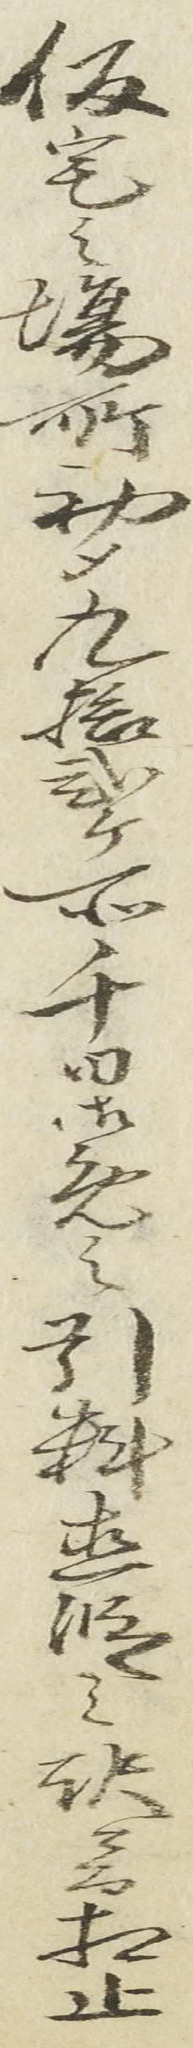仮宅之場所初メ九拾弐ケ所千日御免之引料直段之訳ニ而相止
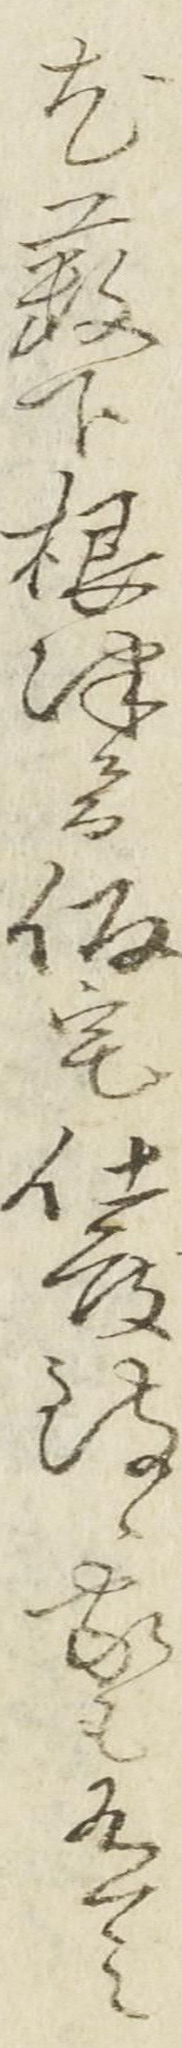尤藪下根津ニ而仮宅仕度致候家も有之
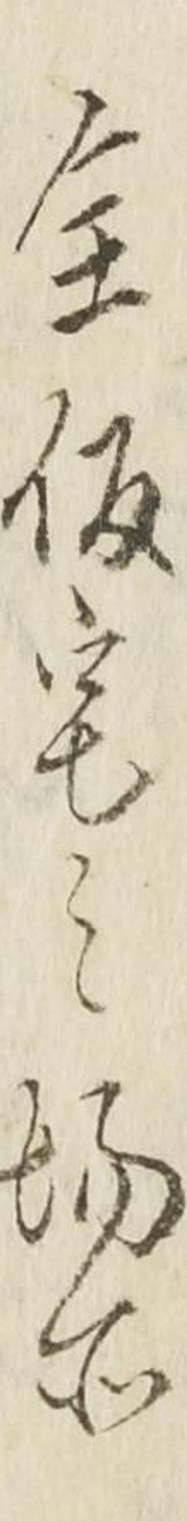全仮宅之場所
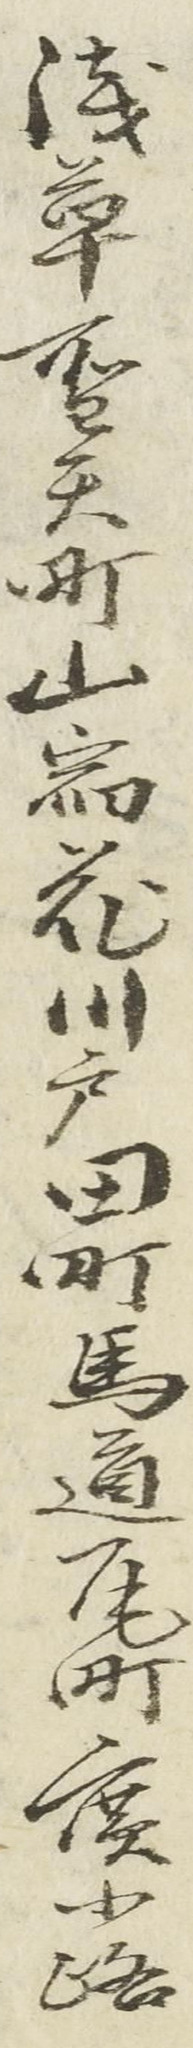浅草聖天町山宿花川戸田町馬道瓦町広小路
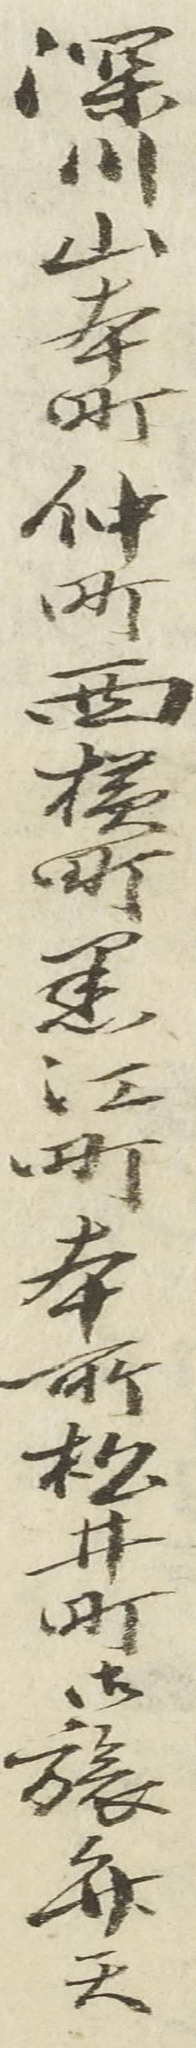深川山本町仲町西横町黒江町本所松井町御旅弁天
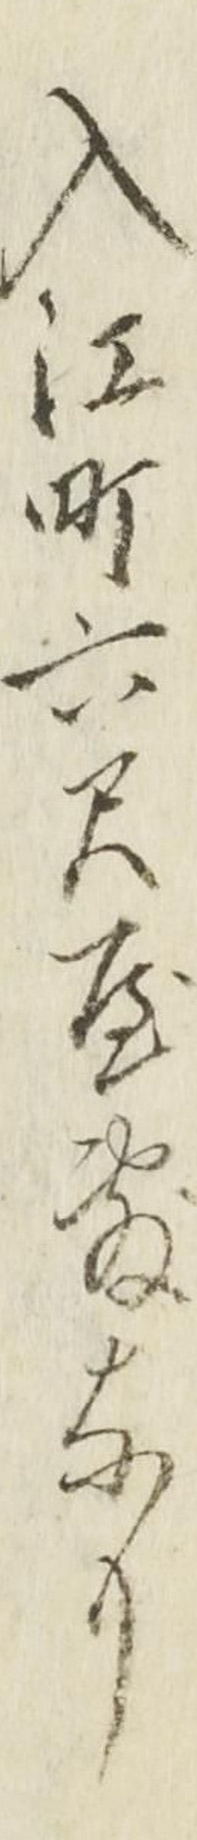入江町六尺屋敷なり
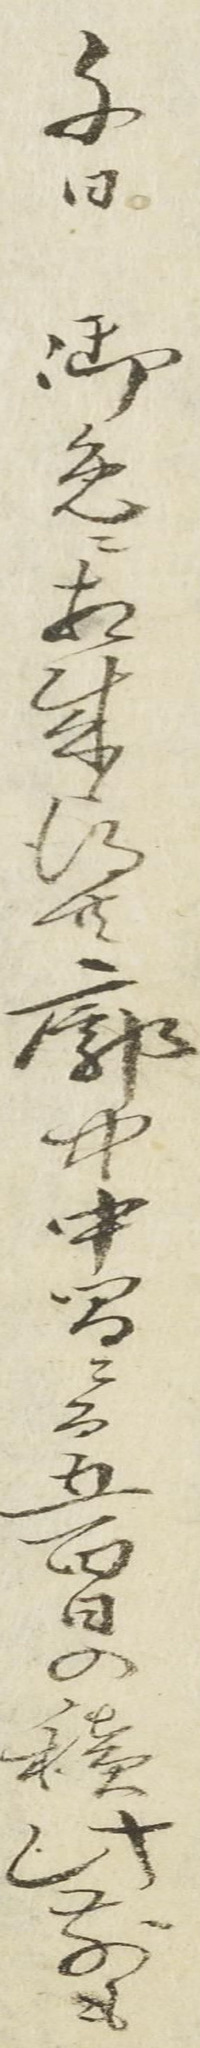千曰御免ニ相成候得共郭中中間ニ而五百日之積此前も
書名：安政二乙卯年十月二日大地震之事
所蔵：東京大学地震研究所図書室 Earthquake Research Institute Library, The University of Tokyo, JAPAN
